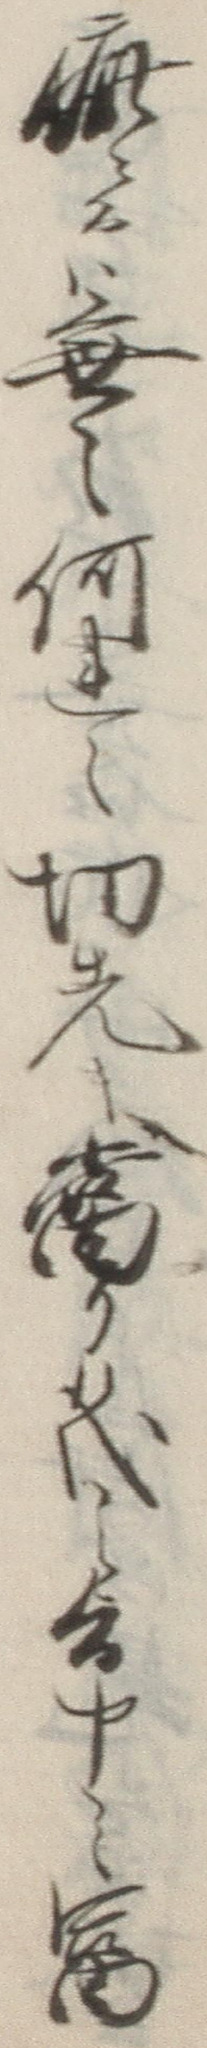疵ニ而ハ無之何れ之切先キ當り候哉之旨申之富
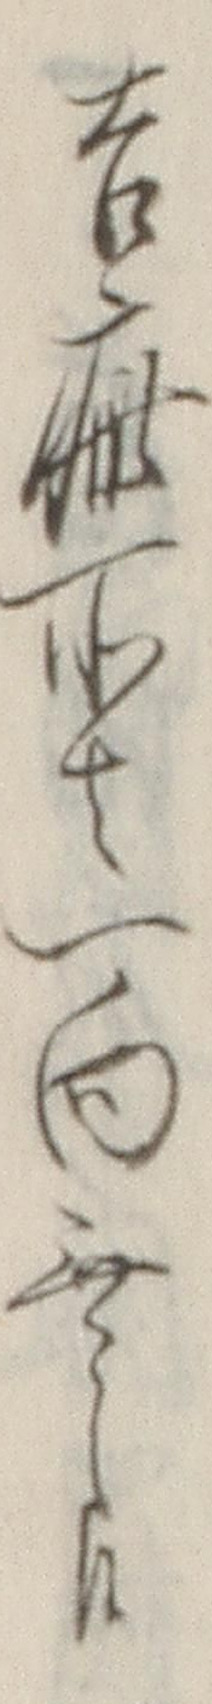吉疵所は一向無之候
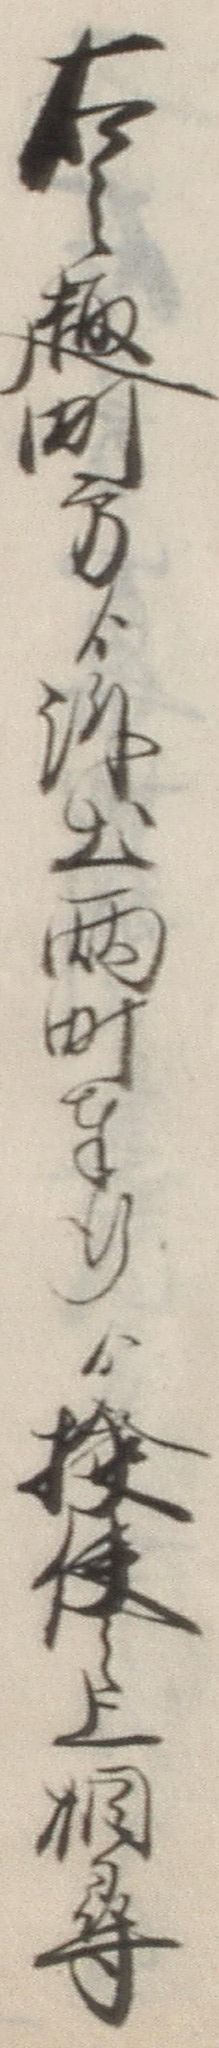右之趣町方ゟ訴出西町奉行ゟ検使之上相尋
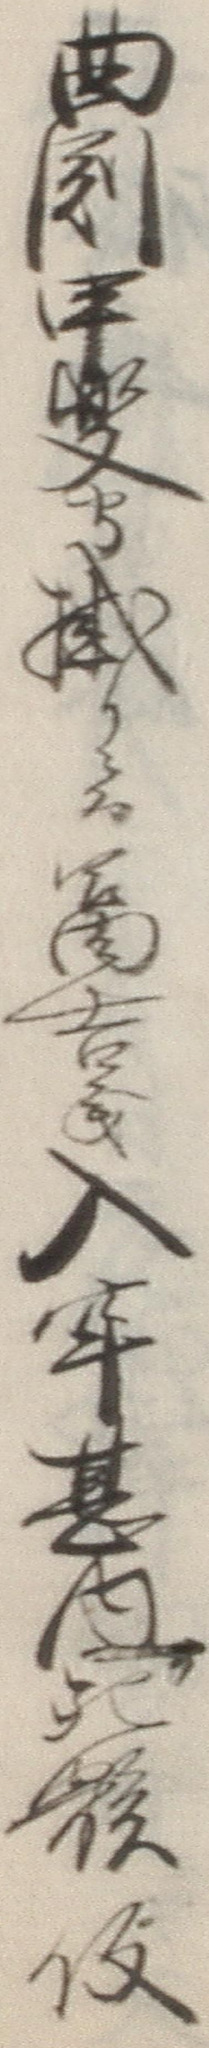曲渕甲斐守掛りニ而富吉義入牢甚内死骸儀
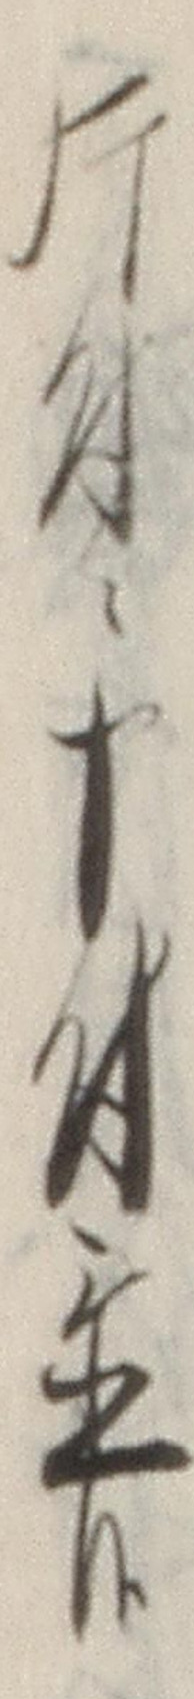片付ニ申付置候
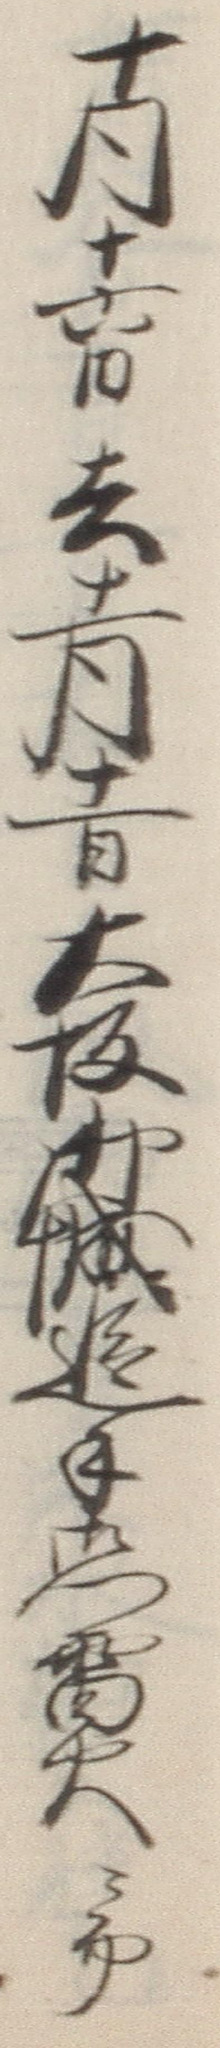十月十六日去十一月十一日大阪御城追手門雷火ニ而
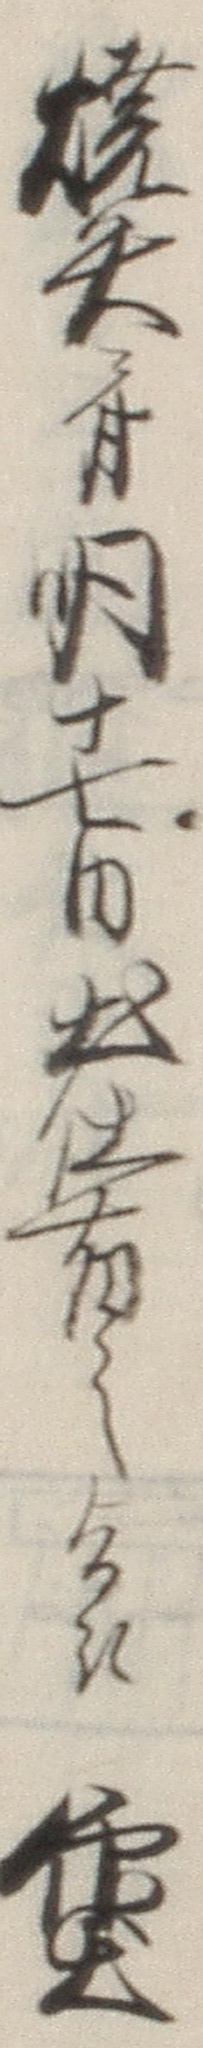焼失ニ付明十七日出仕有之旨被仰出
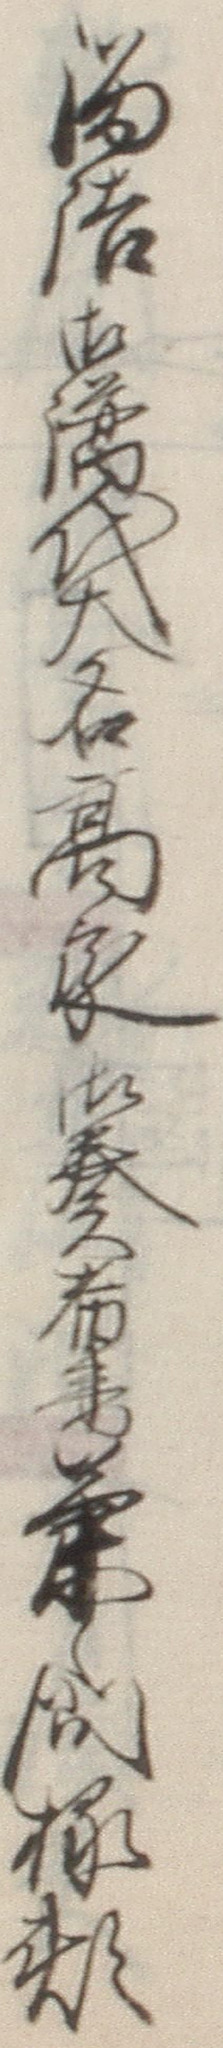溜詰御譜代大名高家御奏者番菊ノ間縁類
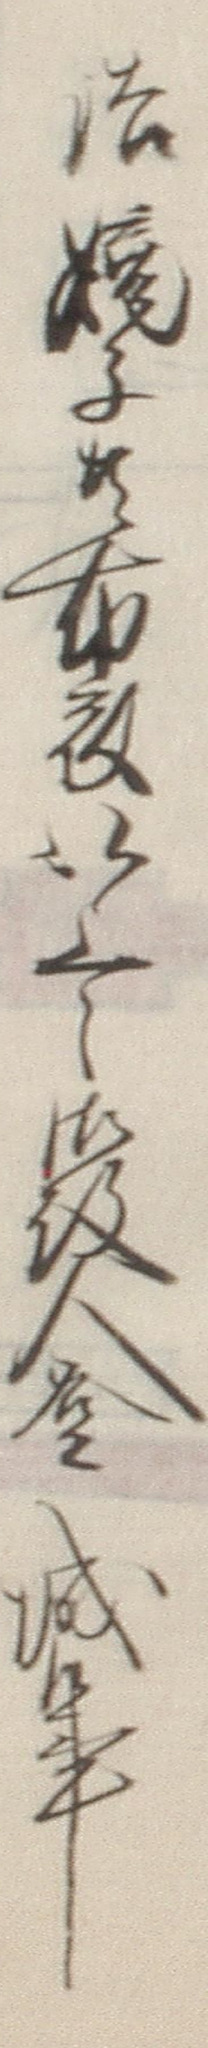詰嫡子共布衣以上之御役人登城候事
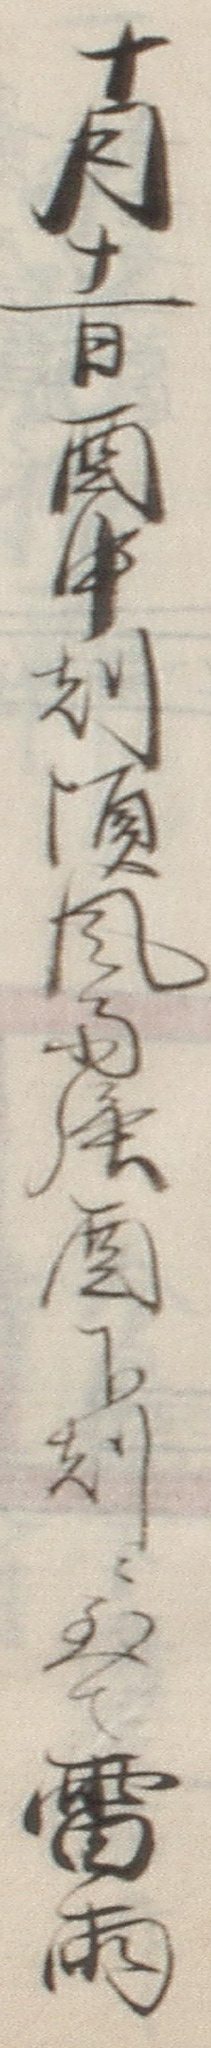十月十一日酉中刻頃風雨強酉下刻ニ至て雷雨
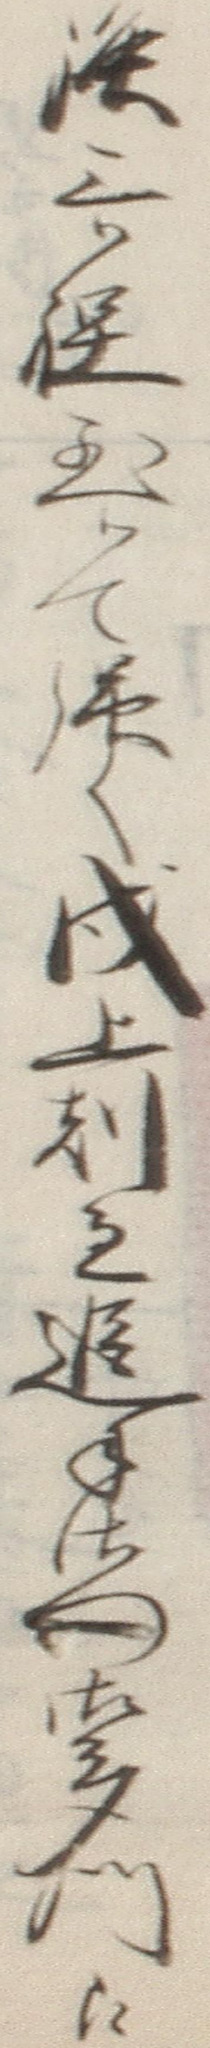強三日程至ツて強く戌上刻過追手御門御多門え
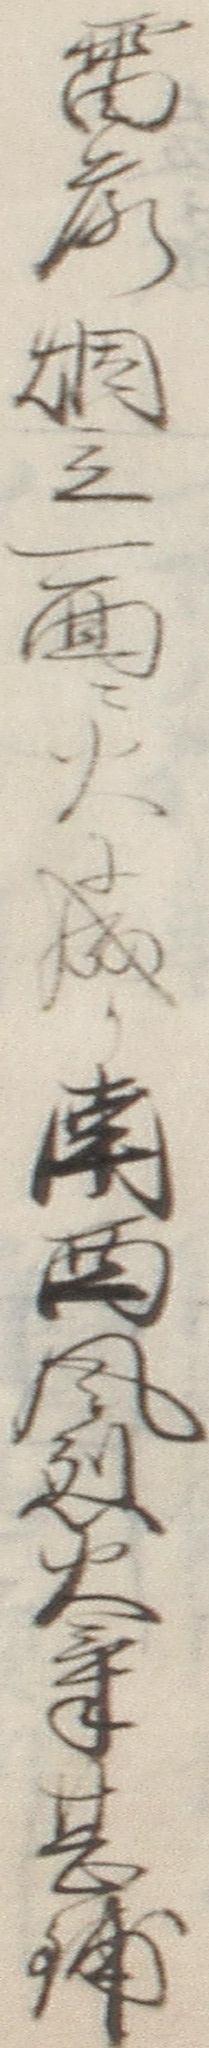雷落烟立一面ニ火に成り南西風裂火気甚鋪
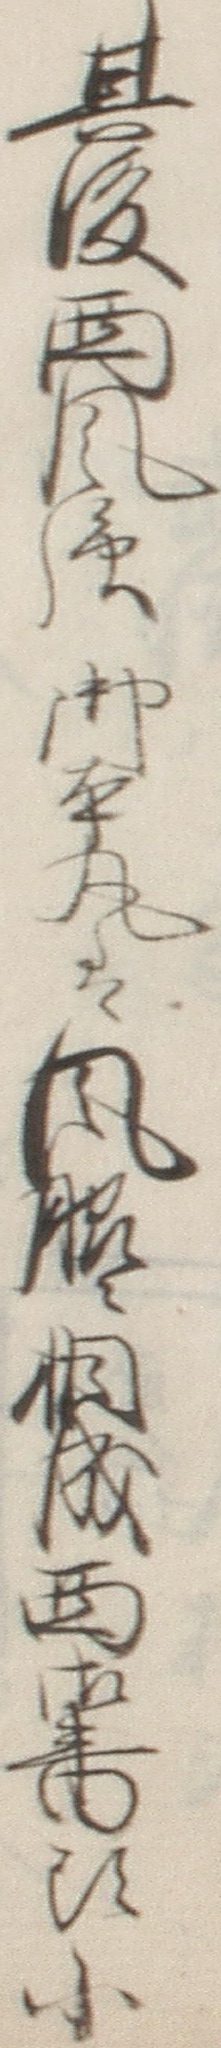其後西風強御本丸は風脇ニ相成西御番頭小
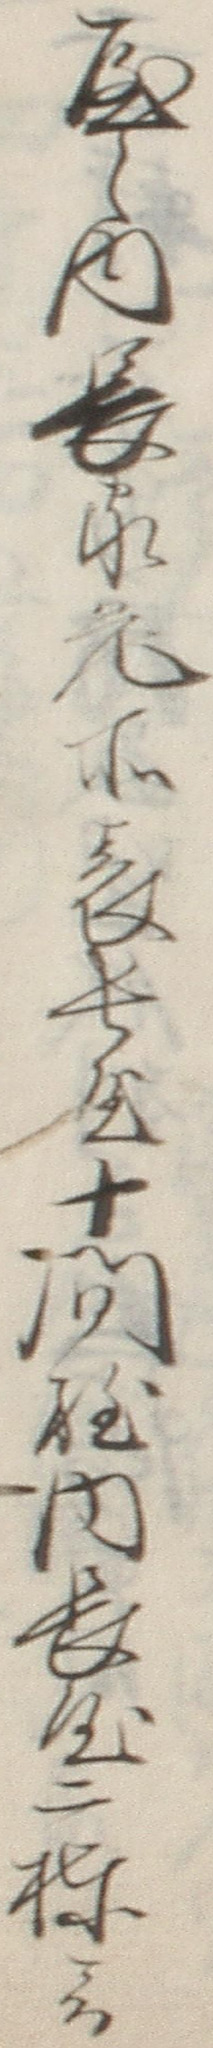屋之内長家衆所表長屋十間程内長屋ニ棟ニ而

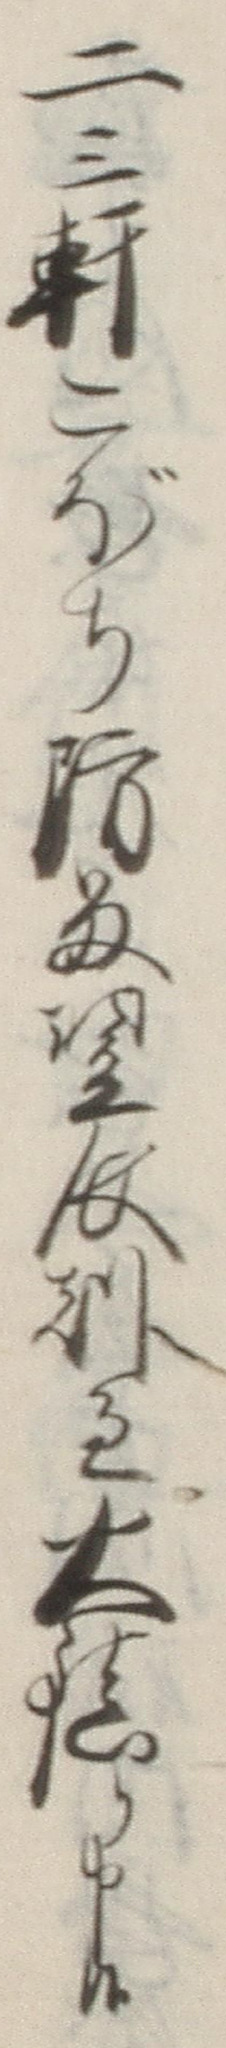ニ三軒こぼち防留翌辰刻過火鎮り申候
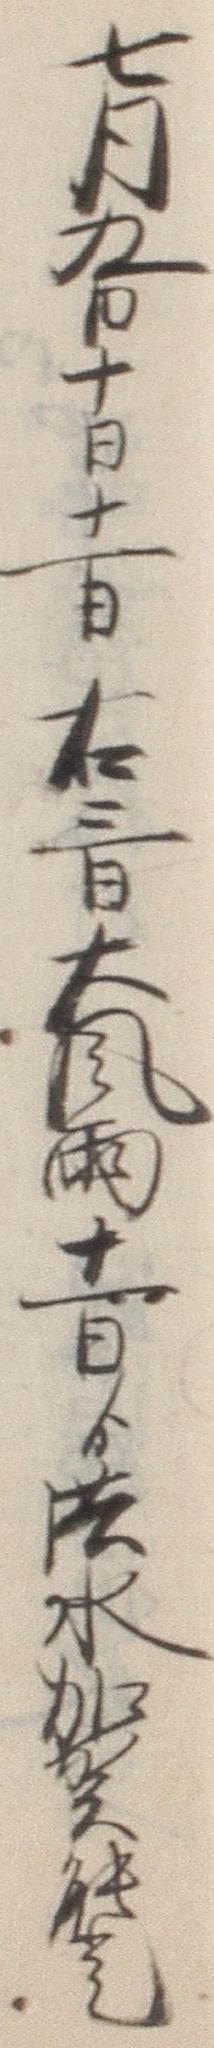七月九日十日十一日右三日大風雨十一日ゟ洪水加賀能登
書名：[諸国災害記録]
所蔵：東京大学地震研究所図書室 Earthquake Research Institute Library, The University of Tokyo, JAPAN
